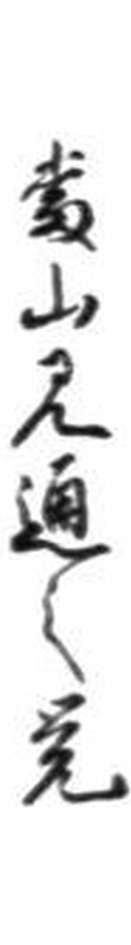当山見通之覚
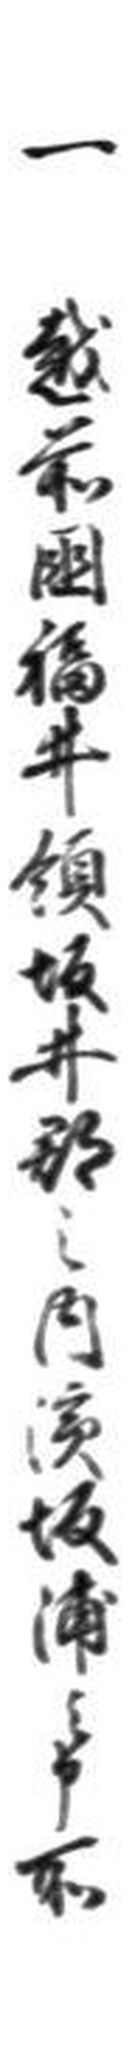一越前国福井領坂井郡之内浜坂浦与申所
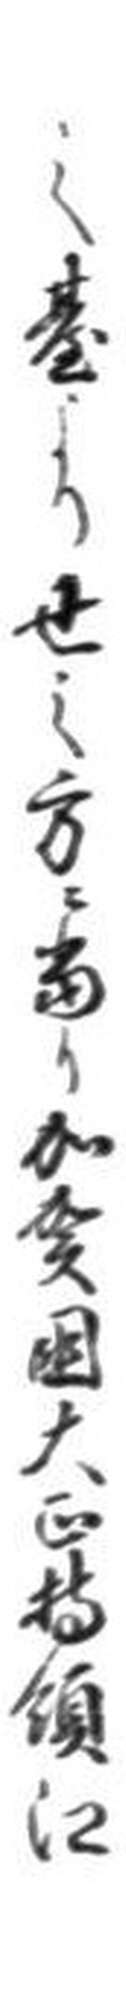之台より丑之方ニ当り加賀国大正持領江
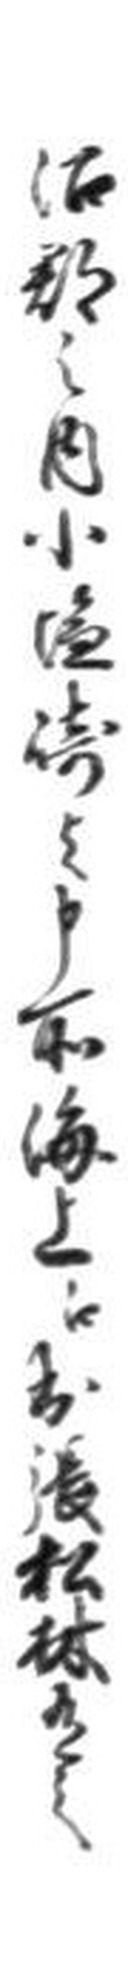沼郡之内小塩崎与申所海上江出張松林有之
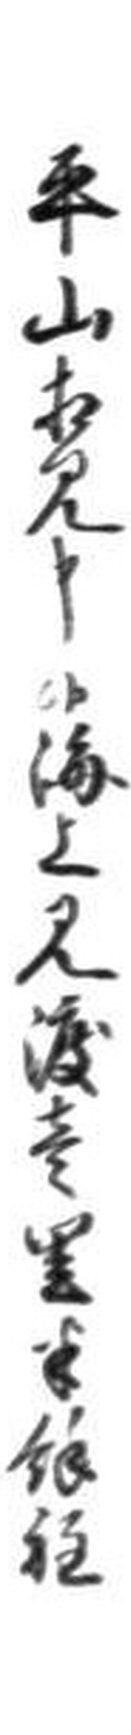平山相見申候海上見渡壱里半余程
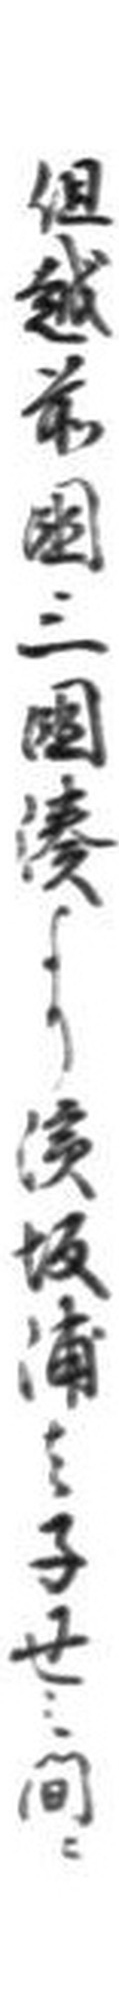但越前国三国湊より浜坂浦者子丑之間ニ
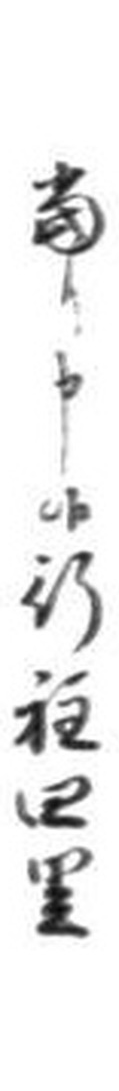当り申候行程四里
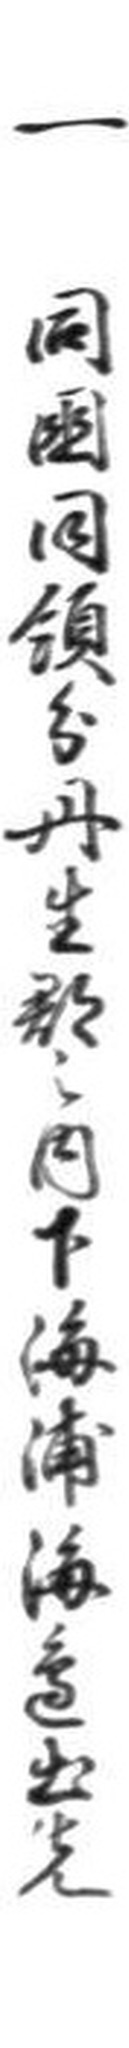一同国同領分丹生郡之内下海浦海辺出先

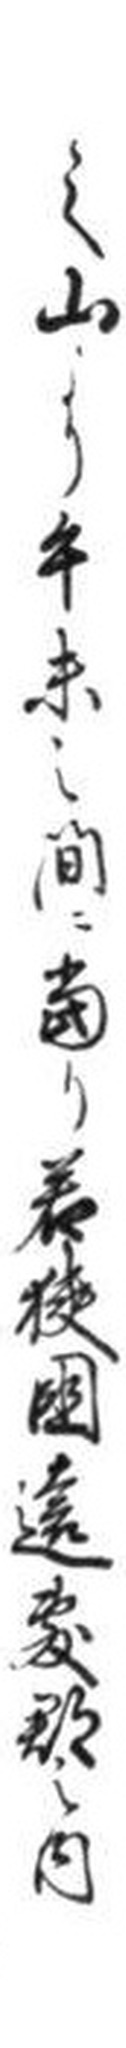之山より午未之間ニ当り若狭国遠敷郡之内
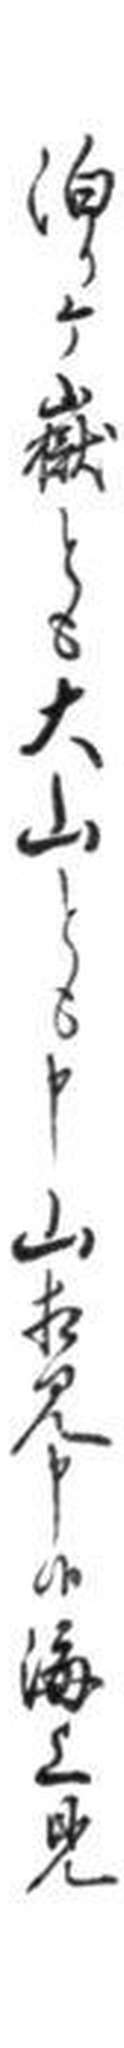泊ケ嶽とも大山とも申山相見申候海上見
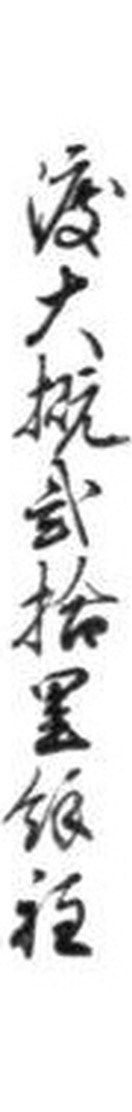渡大概弐拾里余程
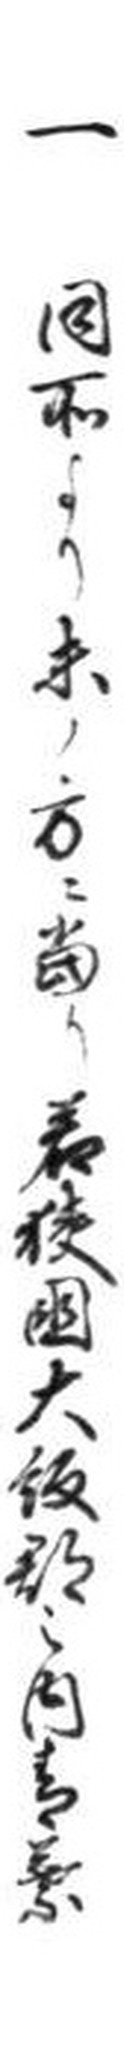一同所より未ノ方ニ当り若狭国大飯郡之内青葉
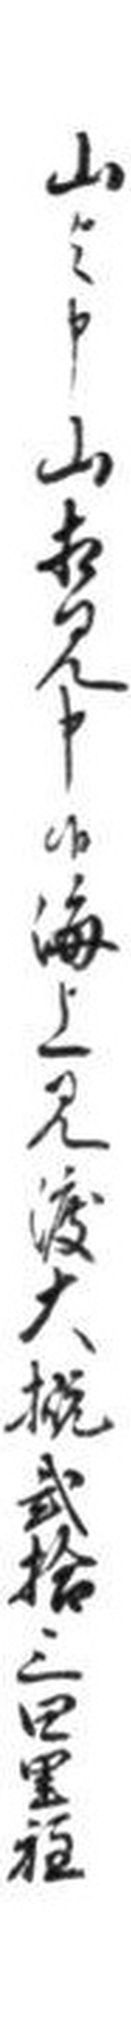山与申山相見申候海上見渡大概弐拾三四里程
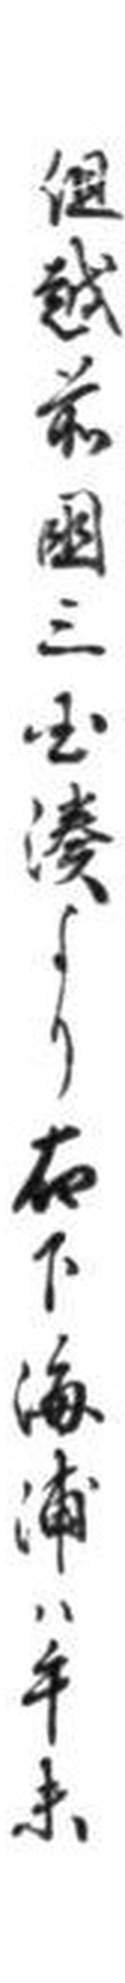但越前国三国湊より右下海浦ハ午未
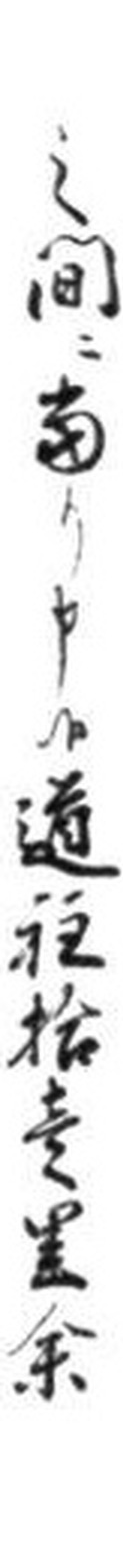之間ニ当り申候道程拾壱里余
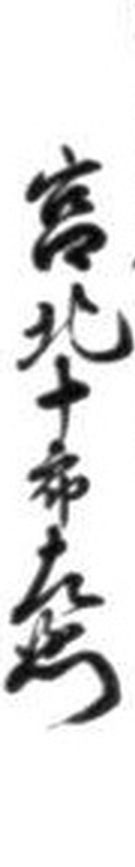宮北十郎左衛門
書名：家譜 三十二 吉邦公 従享保二年到享保三年
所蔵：福井県文書館 Fukui Prefectural Archives
